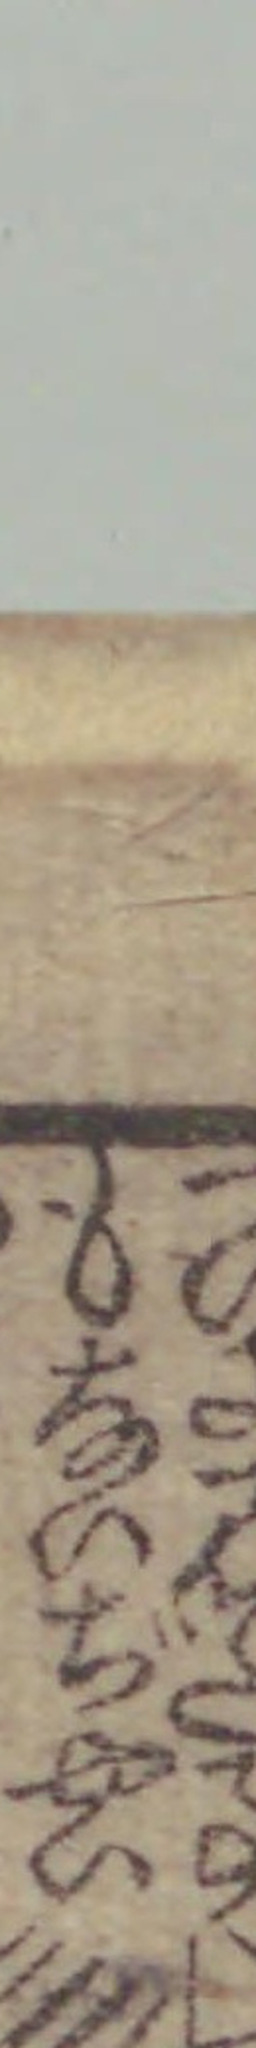もないぢやい
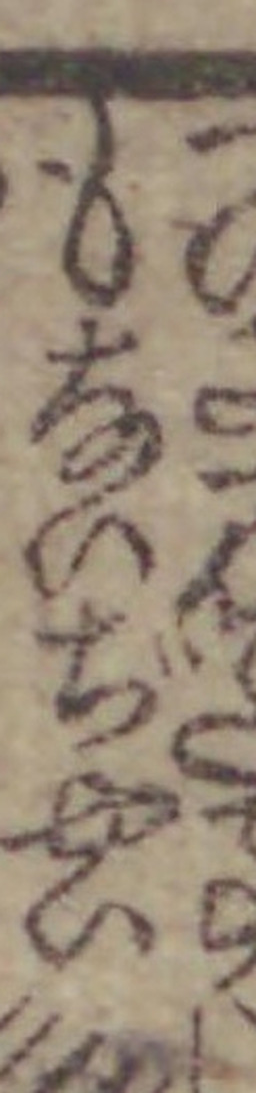もないぢやい
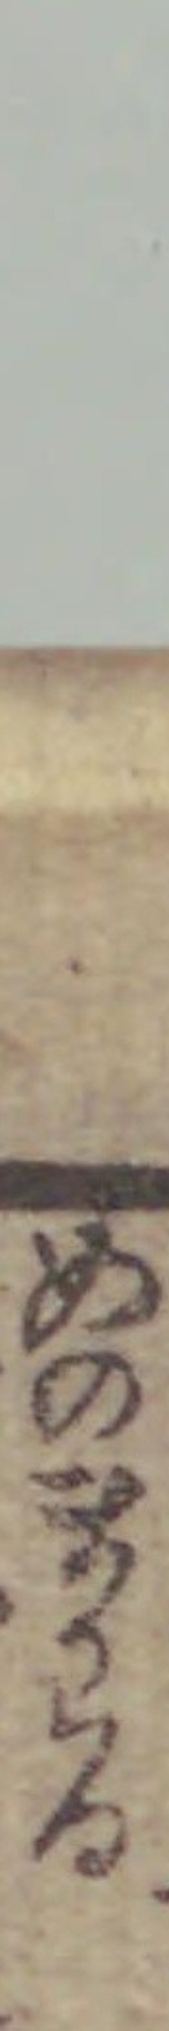めのまわる
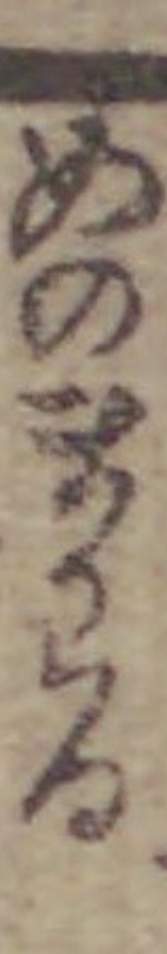めのまわる
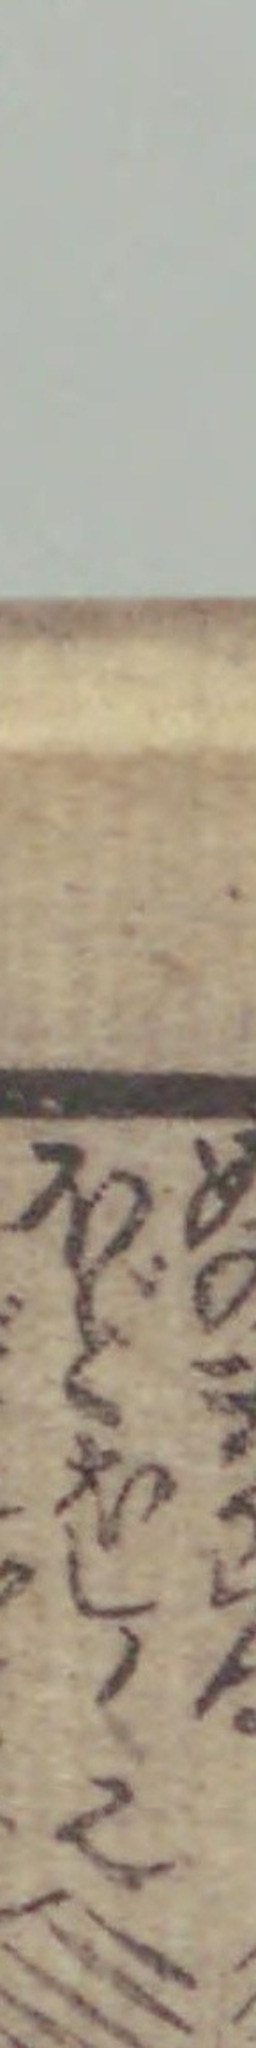ほどほしく也
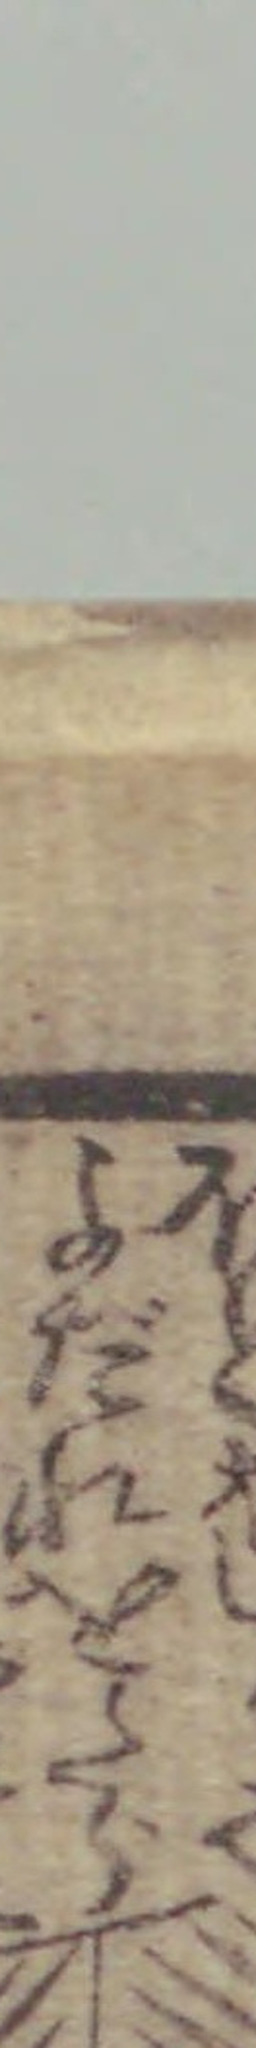よだれをたら
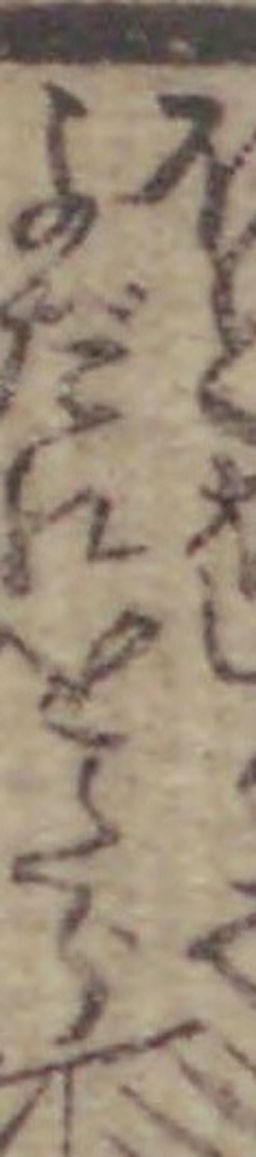よだれをたら
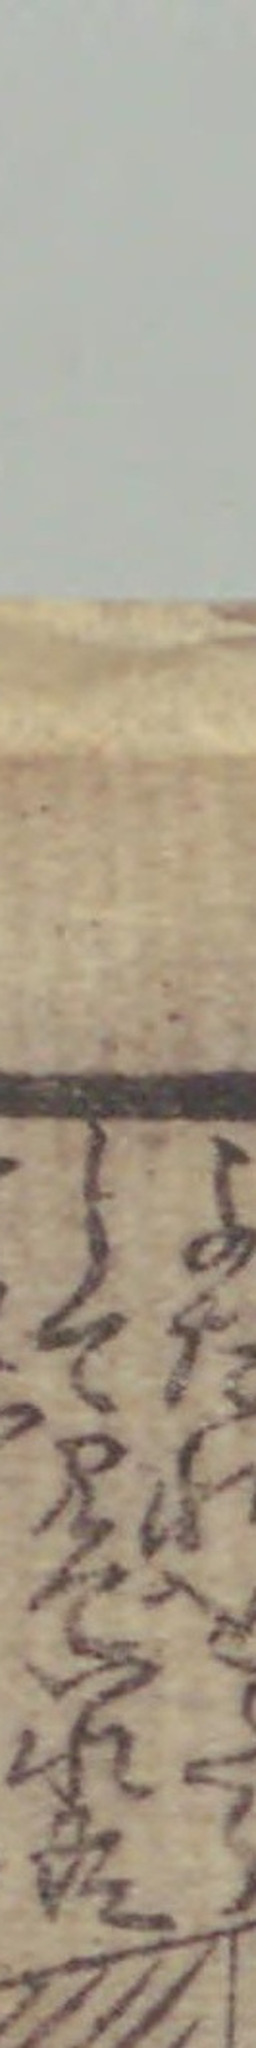して見ていれす
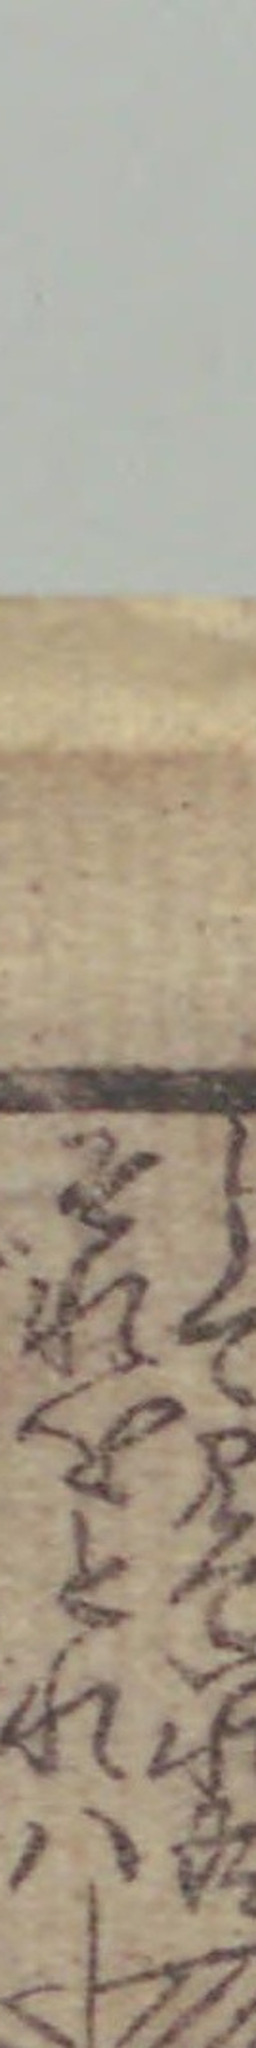それをとれは
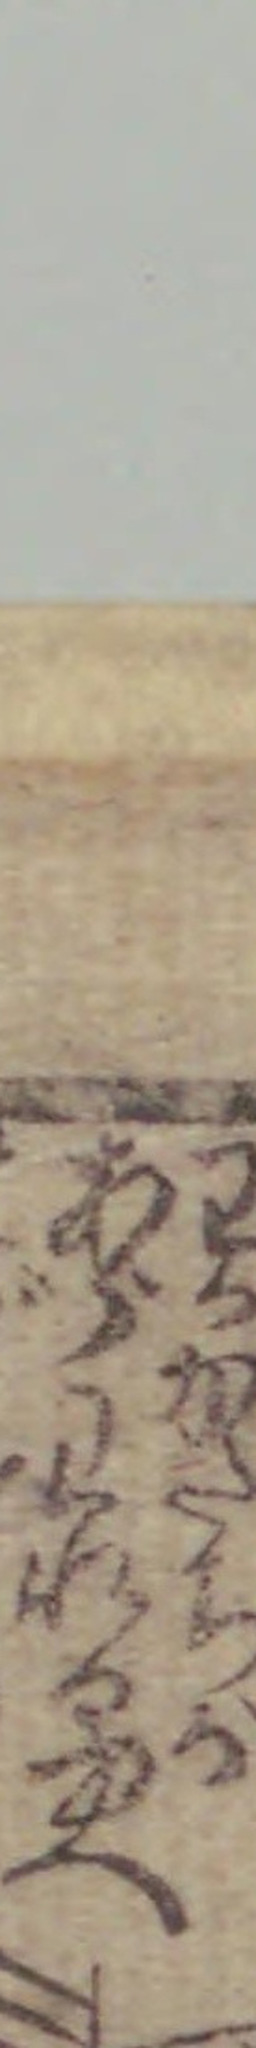あらわれるゆへ
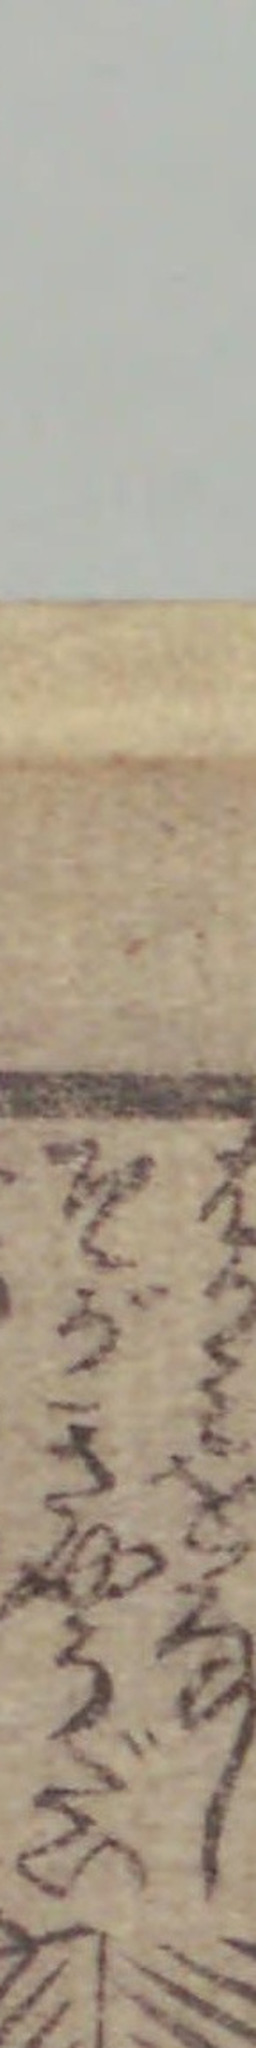そがきやうだい
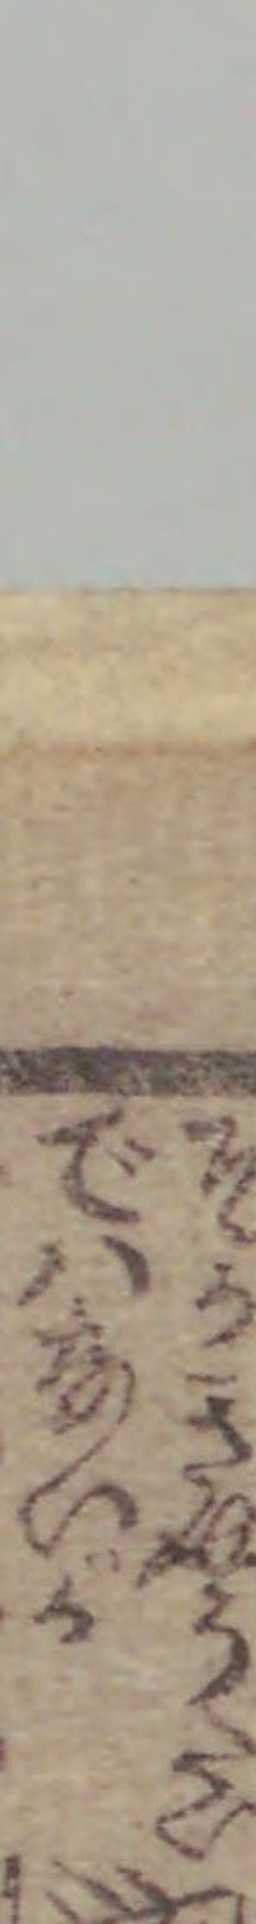ではないが

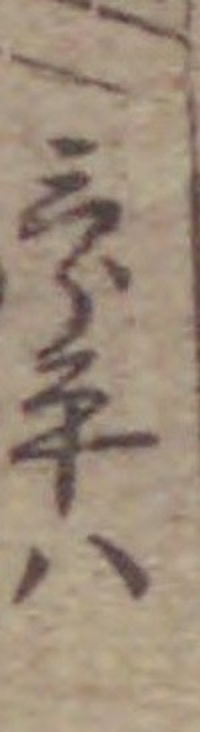三郎平は
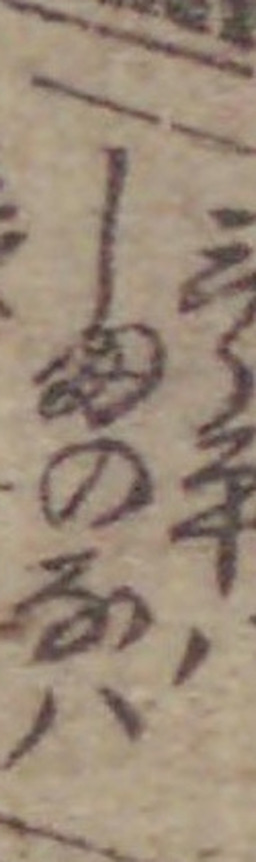しまのなは
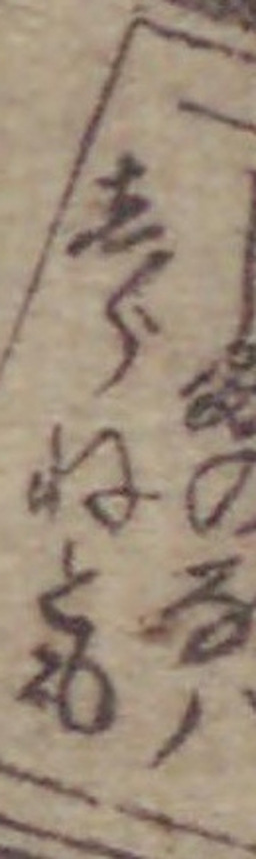しらねとも
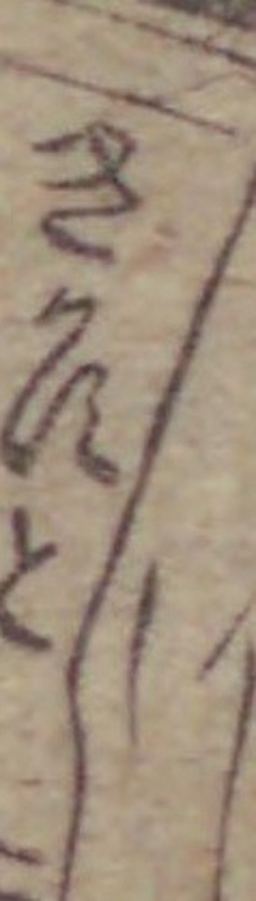きかすと
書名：近頃嶋めぐり 3巻
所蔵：国立国会図書館 National Diet Library, JAPAN
